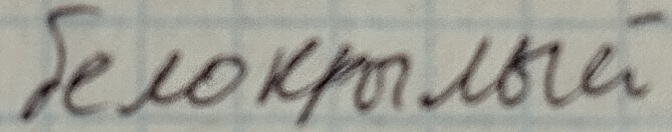белокрылый
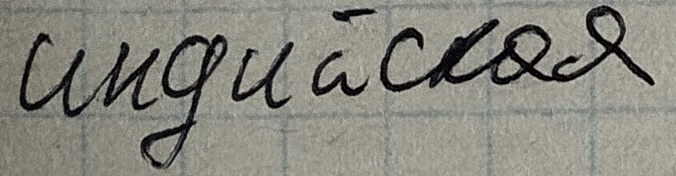индийская
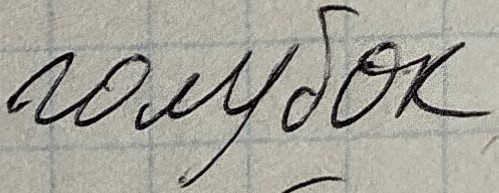голубок
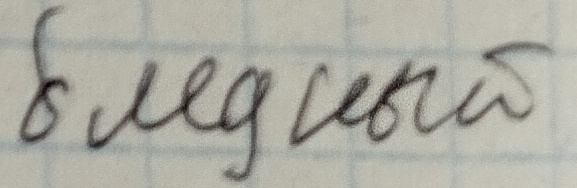бледный
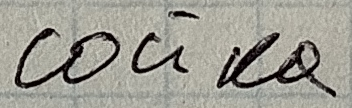сойка
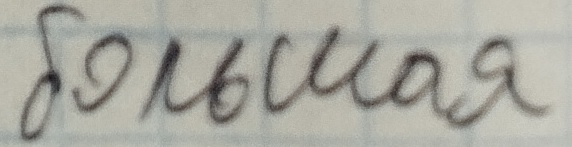большая
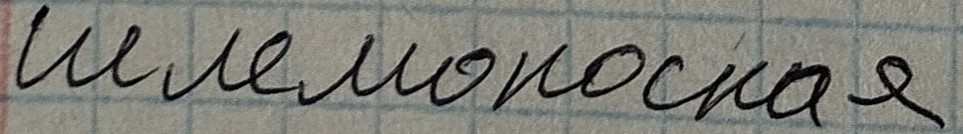шлемоносная
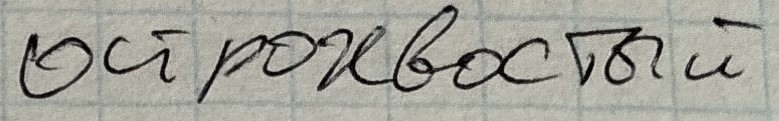острохвостый
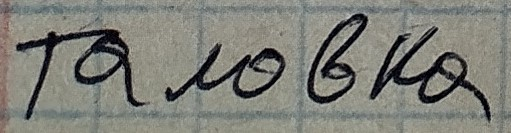таловка
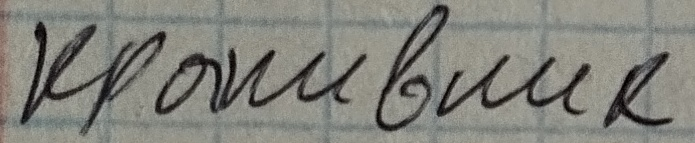крапивник
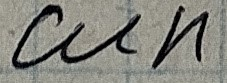сип
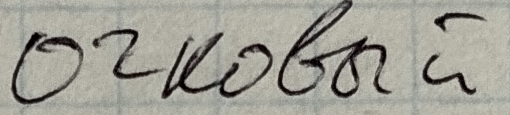очковый
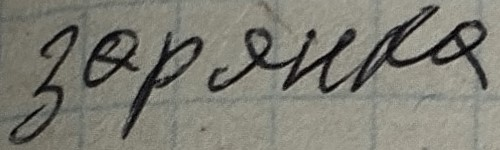зарянка
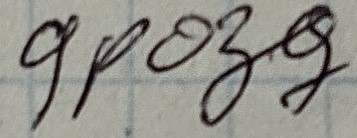дрозд
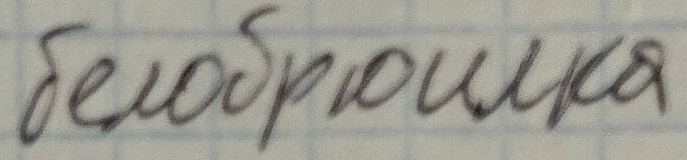белобрюшка
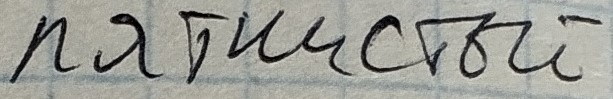пятнистый
